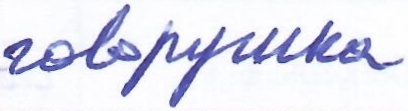говорушка
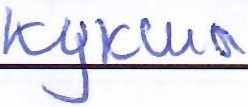кукша
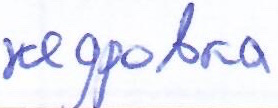кедровка
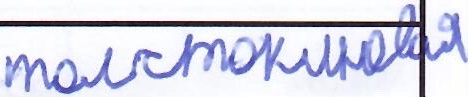толстоклювая
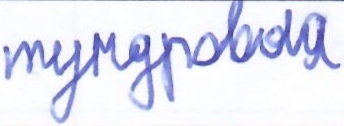тундровая
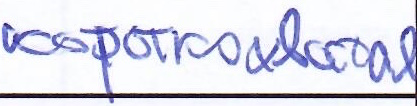короткохвостая
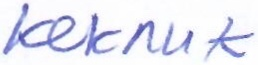кеклик
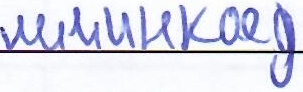личинкоед
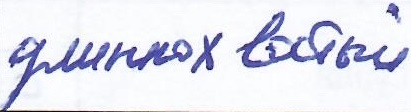длиннохвостый
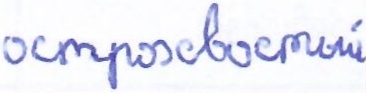острохвостый
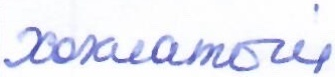хохлатый
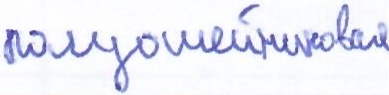полуошейниковая
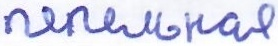пепельная
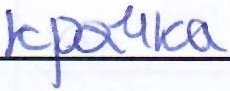крачка
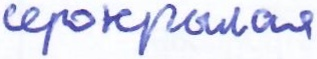серокрылая
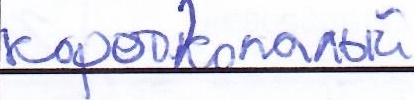короткопалый
